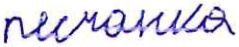песчанка
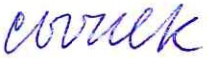сычик
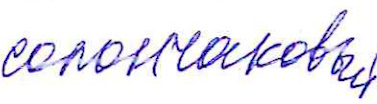солончаковый
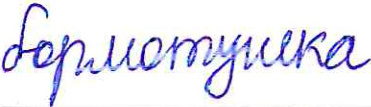бормотушка
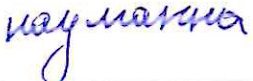науманна
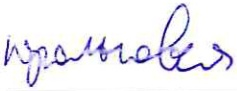крольковся
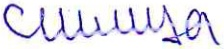синица
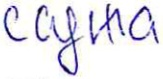саджа
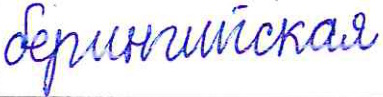берингийская
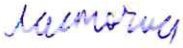ласточка
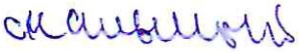скалыный
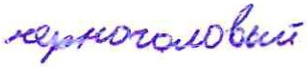черноголовый
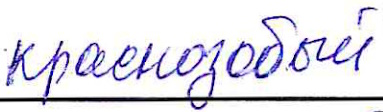краснозобый
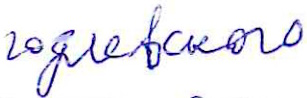годлевского
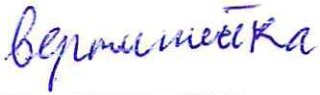вертишейка
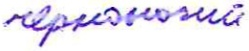черноногий
